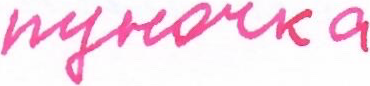пуночка
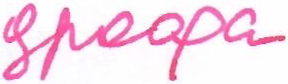дрофа
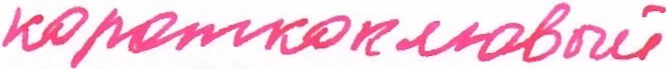короткоклювый
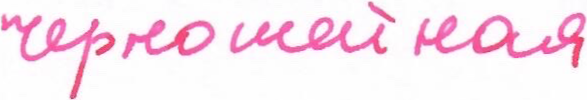черношейная
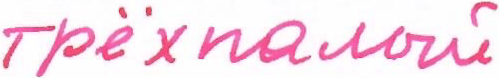трёхпалый
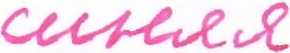синяя
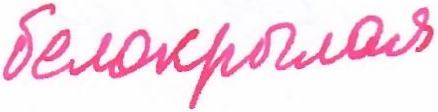белокрылая
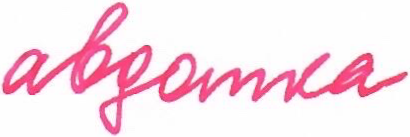авдотка
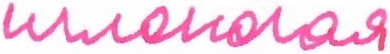иглоногая
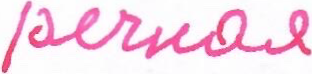речная
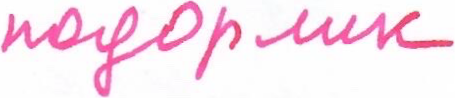подорлик
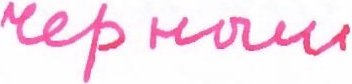черныш
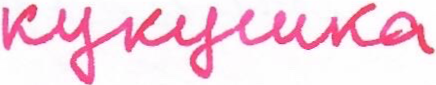кукушка
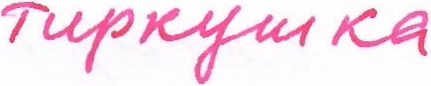тиркушка
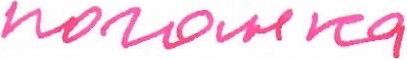поганка
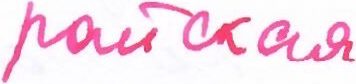райская
